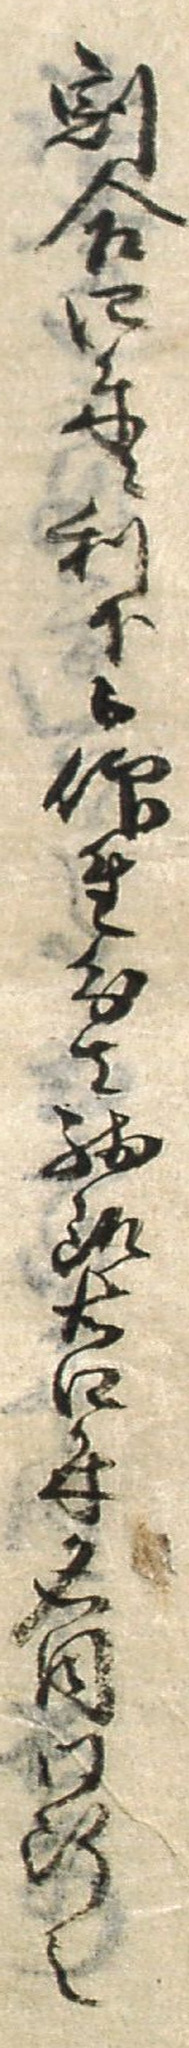割合四朱に利下被仰付候分は残銀右四朱名目同断之
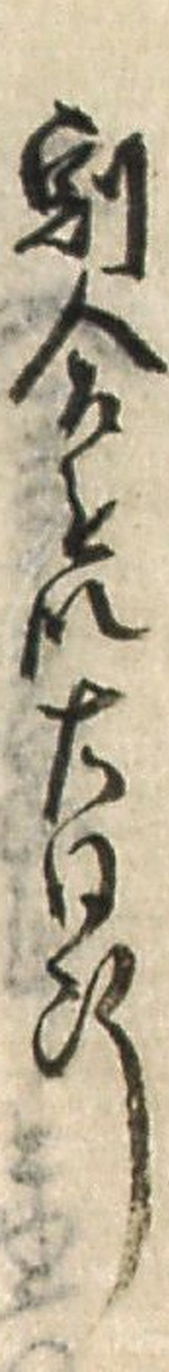割合を以右同断
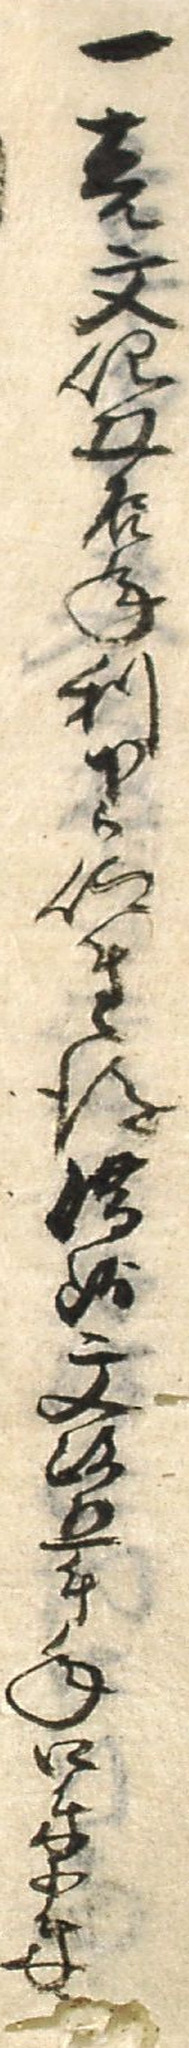一去る文化五辰年利下被仰付候後借銀文政五午年四朱五朱
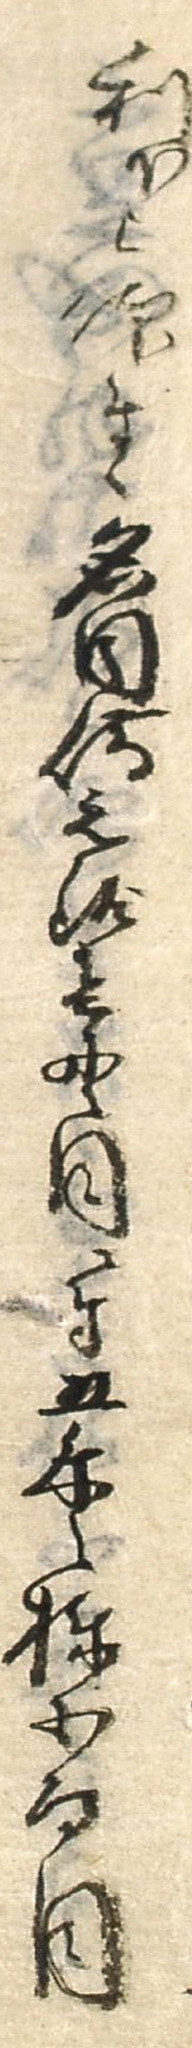利下被仰付候名目借元銀壱貫目に付五朱之株五百目
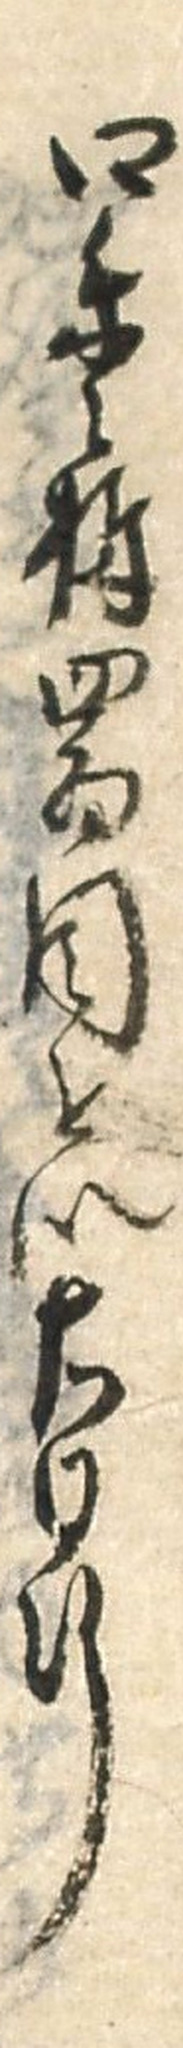四朱之株四百目を以右同断
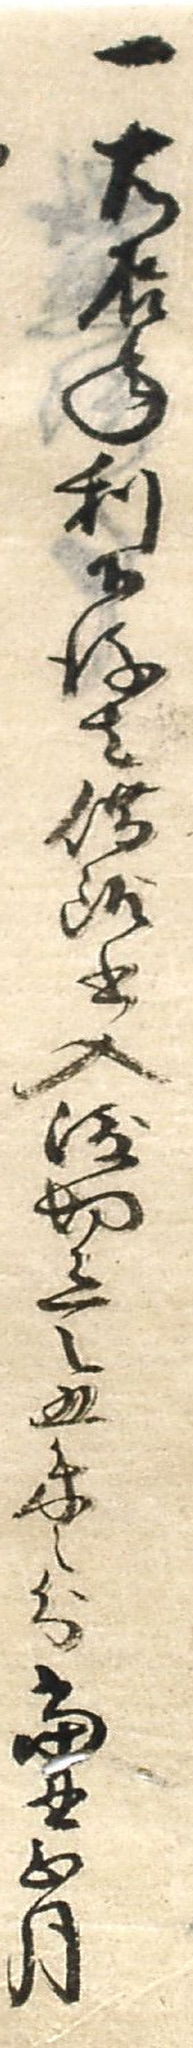一右辰年利下後は借銀書入渡切有之五朱之分当丑正月
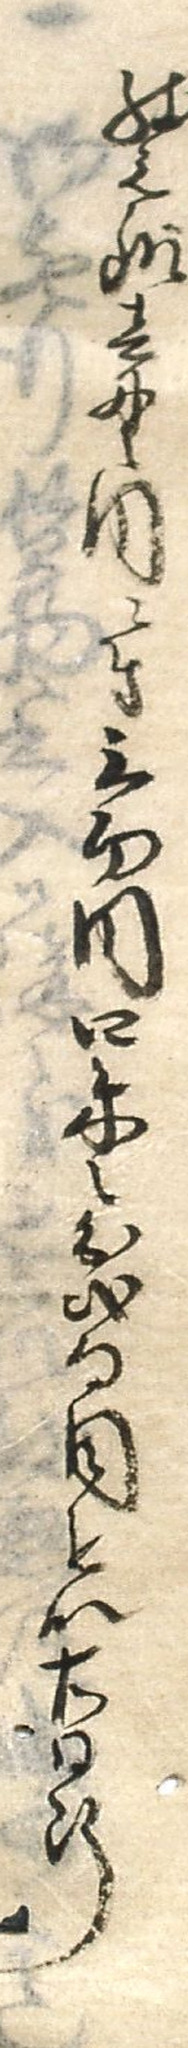残元銀壱貫目に付三百目四朱之分弐百目を以右同断
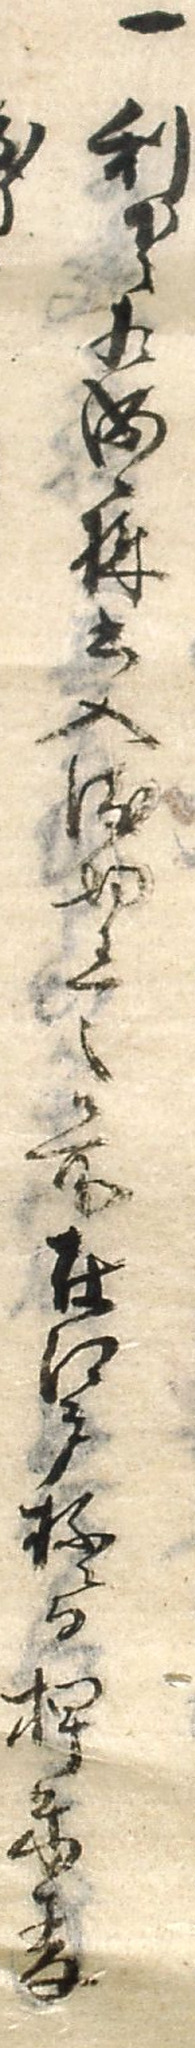一利下に相成候株書入渡切有之候所在江戸抔に而押米麦
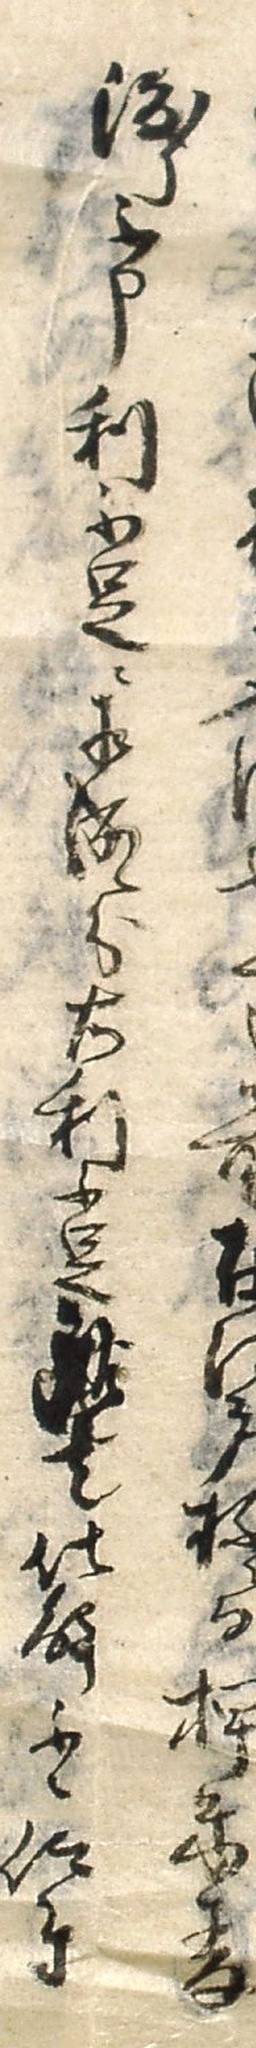渡し不申利不足に相成候分右利不足銀は仕解不被仰付
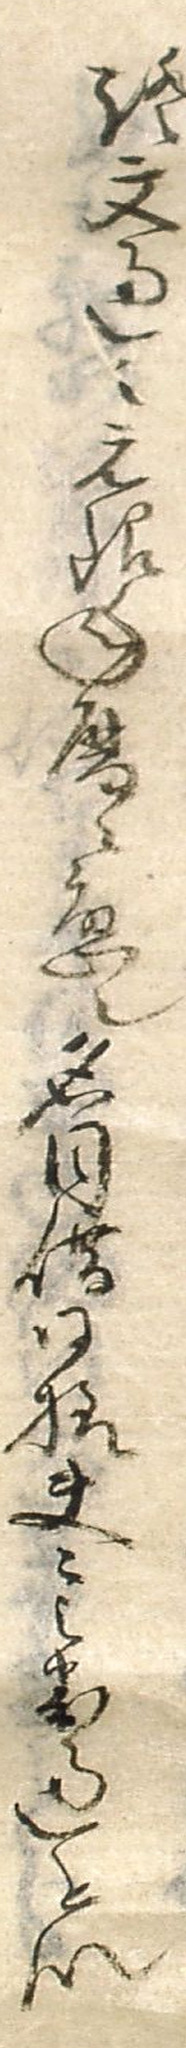証文通之元銀年暦に応し名目借同様夫々之歩通を以
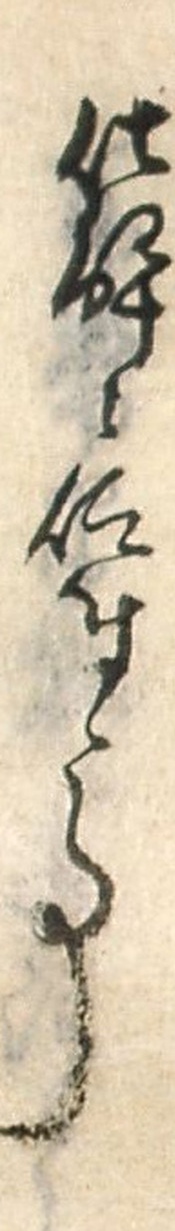仕解被仰付候事
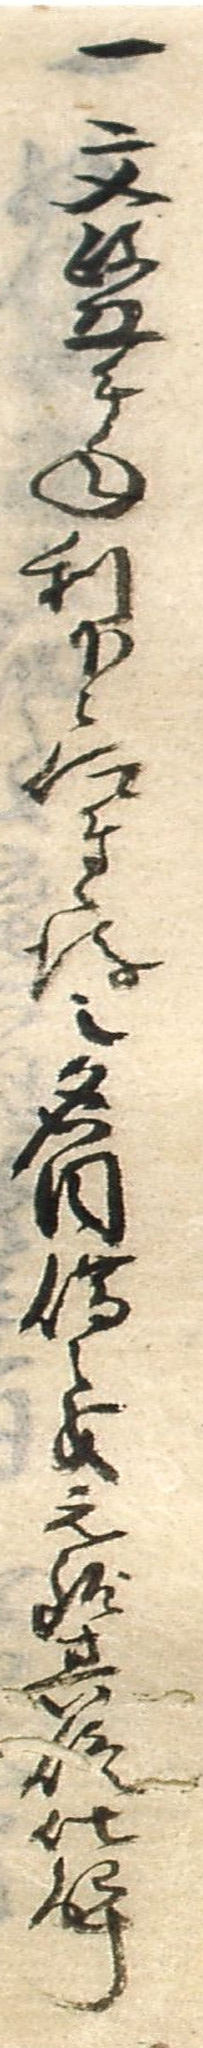一文政五午年利下被仰付候後之名目借之義元銀其儘仕解
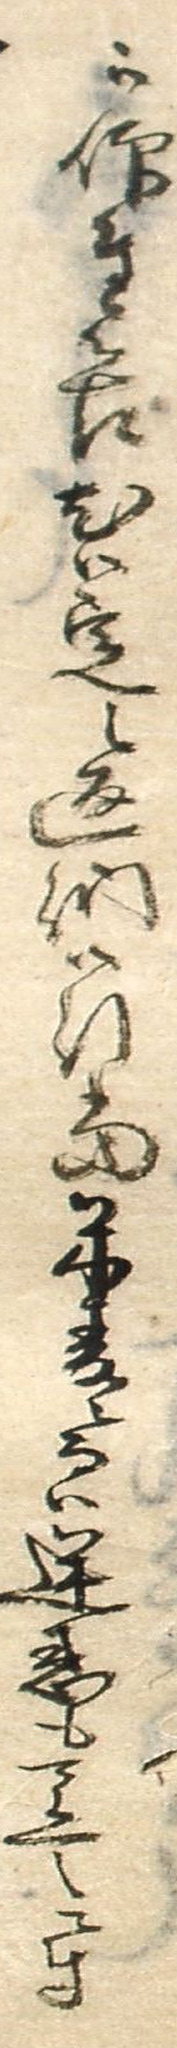被仰付候筈尤御定之返納御引当米麦に而は迷惑も可有之に付
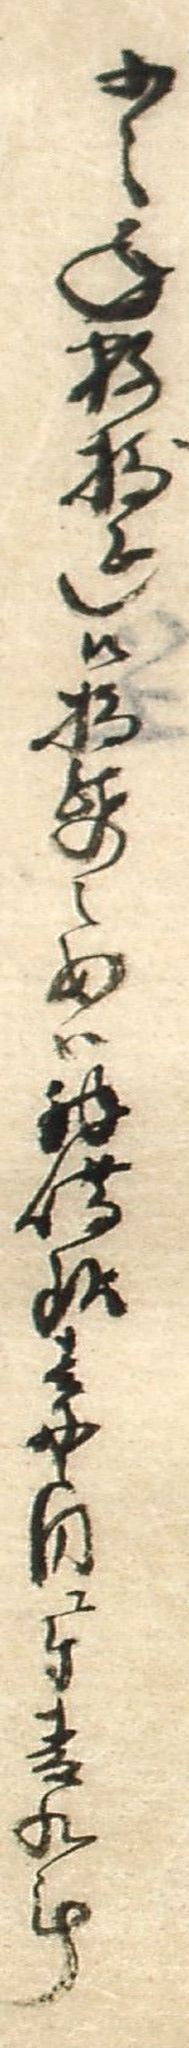少々年数指延候指紙之義は拝借銀壱貫目に付麦九斗
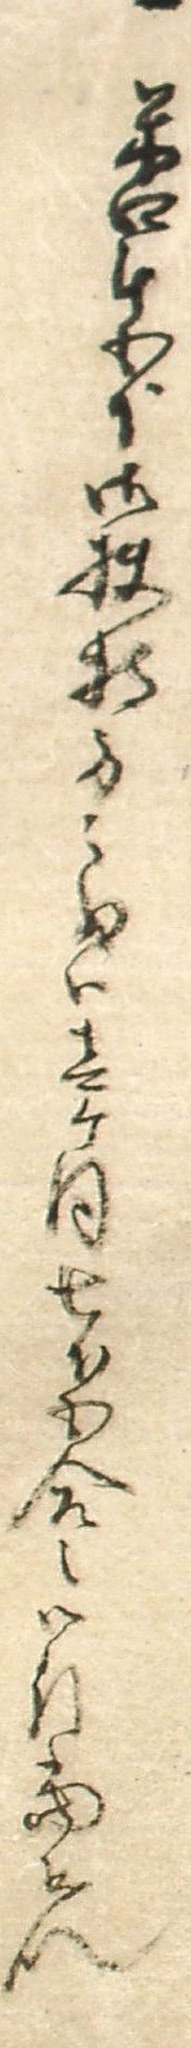一米四斗五升御扶持方之義は壱ヶ月七升五合之御引当を以
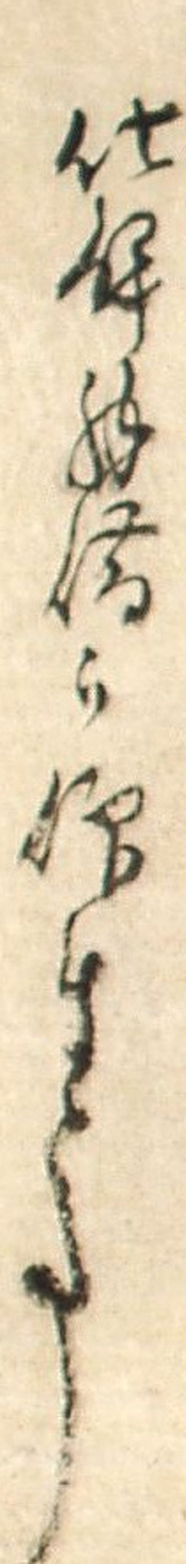仕解拝借被仰付候事
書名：御家中并無格御奉公人借銀御仕解一件御書付写其余共控
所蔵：鳴門教育大学 Naruto University of Education
